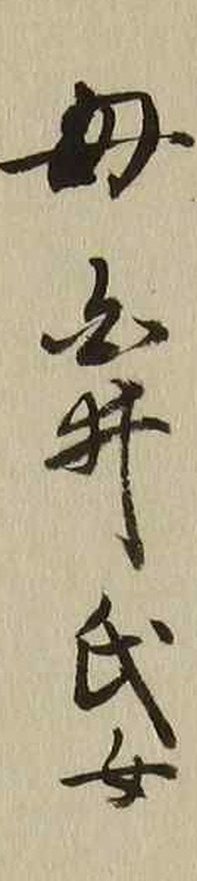母白井氏女
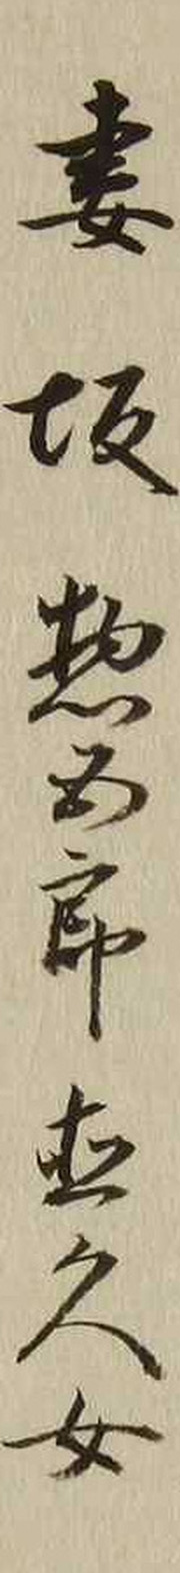妻坂惣五郎直久女
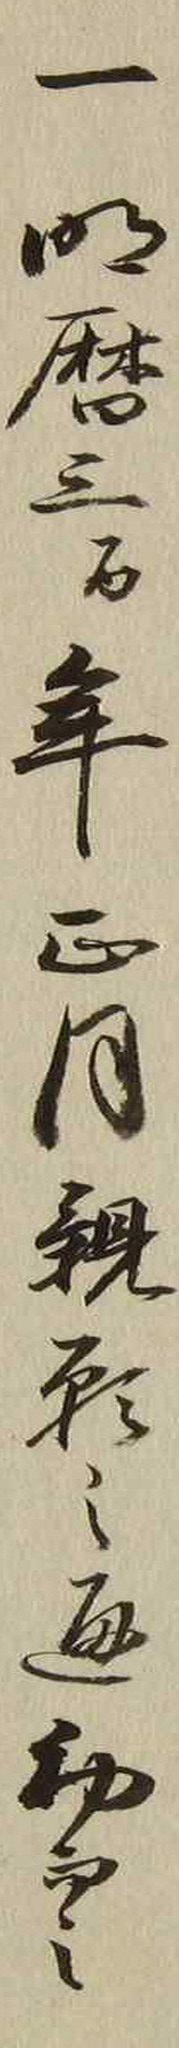一明暦三酉年正月親願之通初而之
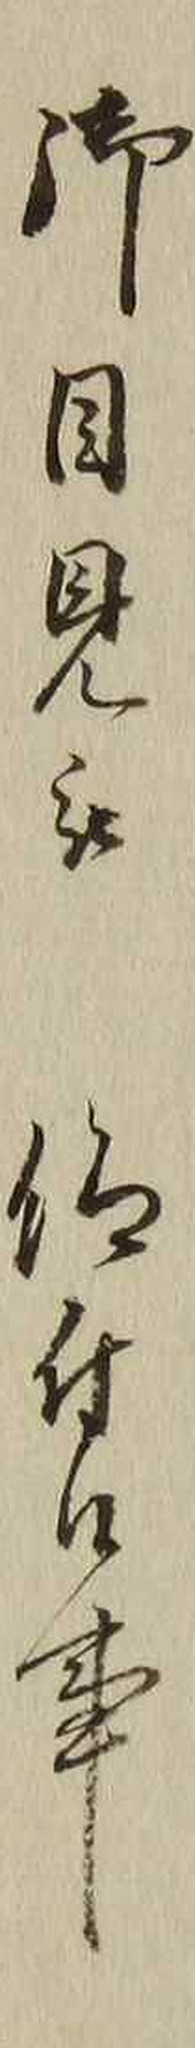御目見被仰付候事
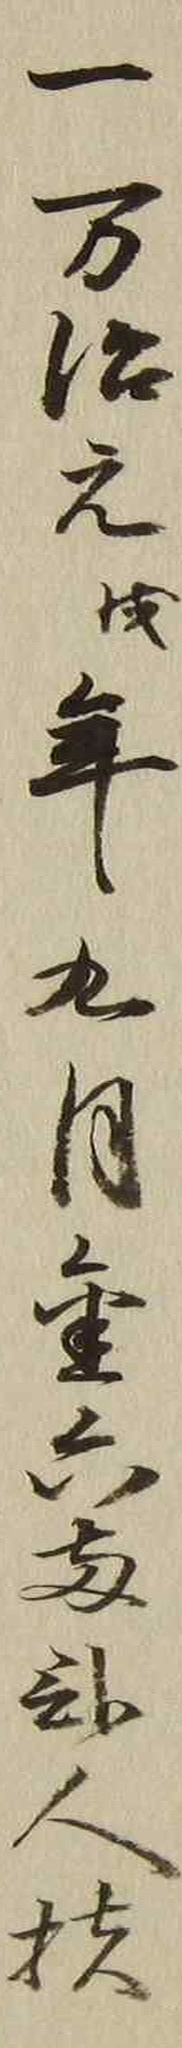一万治元戌年九月金六両弐人扶
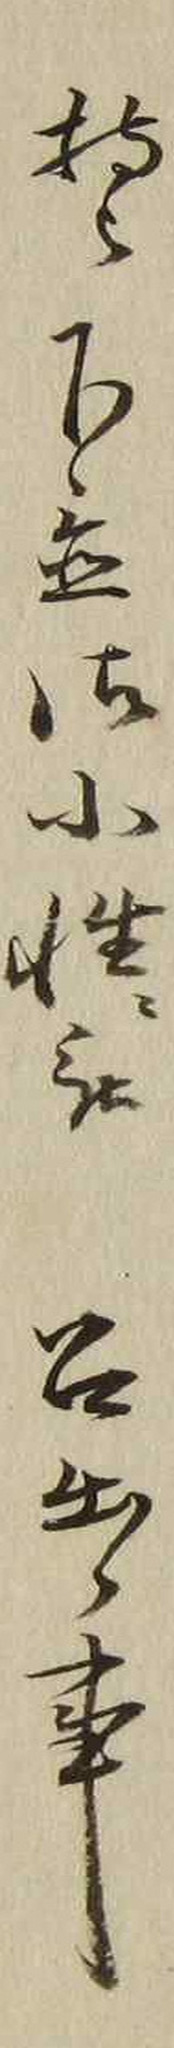持被下置御小性ニ被召出候事
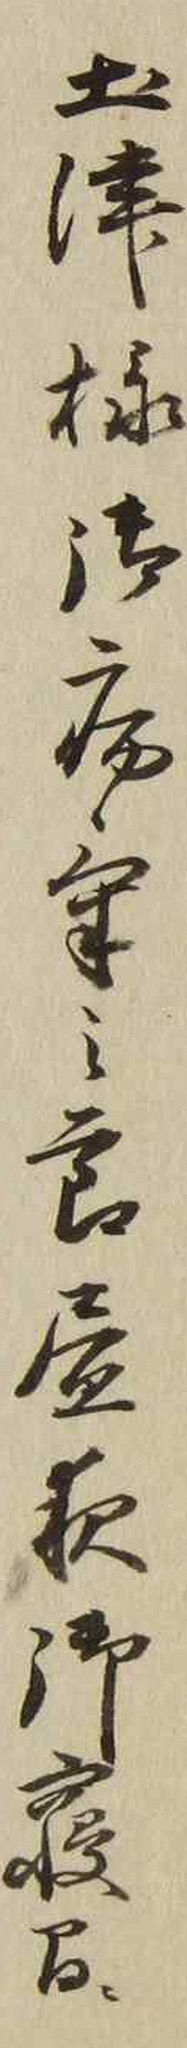土津様御病気之節昼夜御寝間ニ
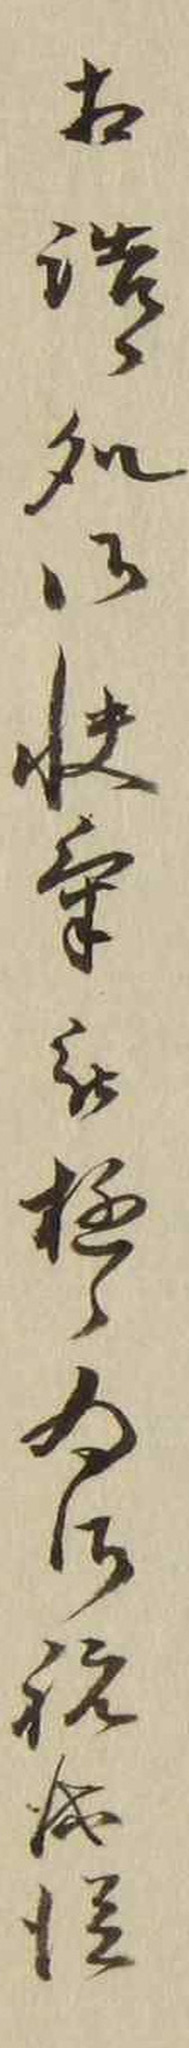相詰候処御快気被遊候為御祝儀従

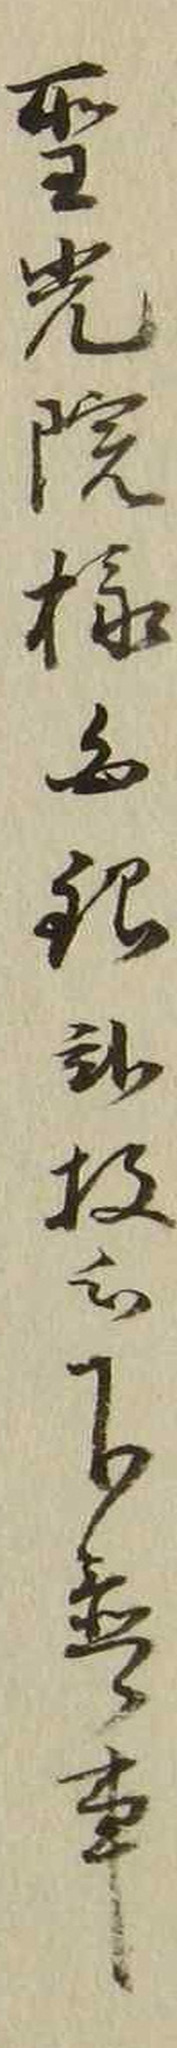聖光院様白銀弐枚被下置候事
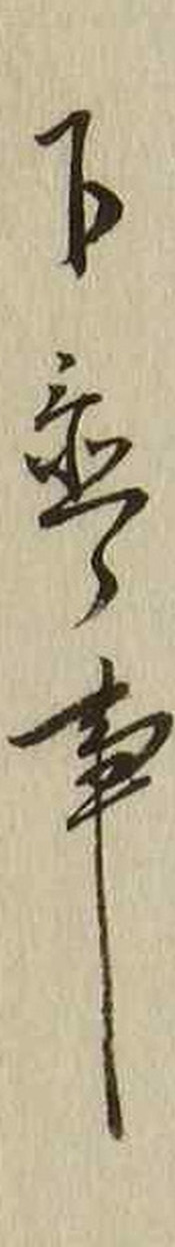下置候事
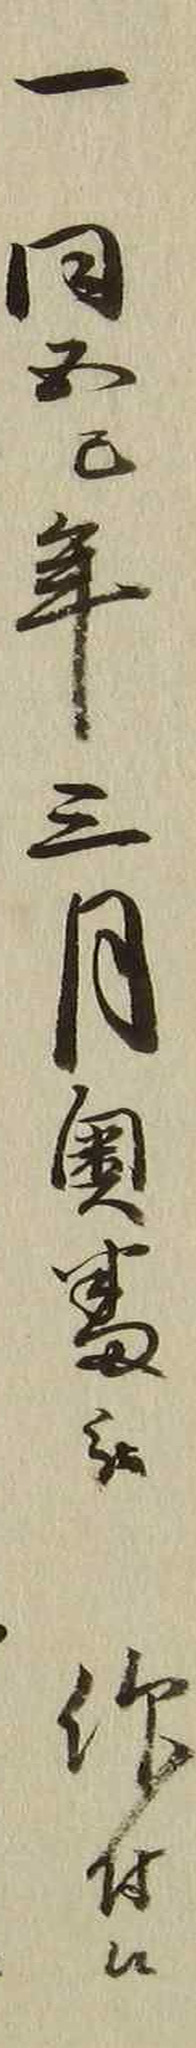一同五巳年三月奥書被仰付候
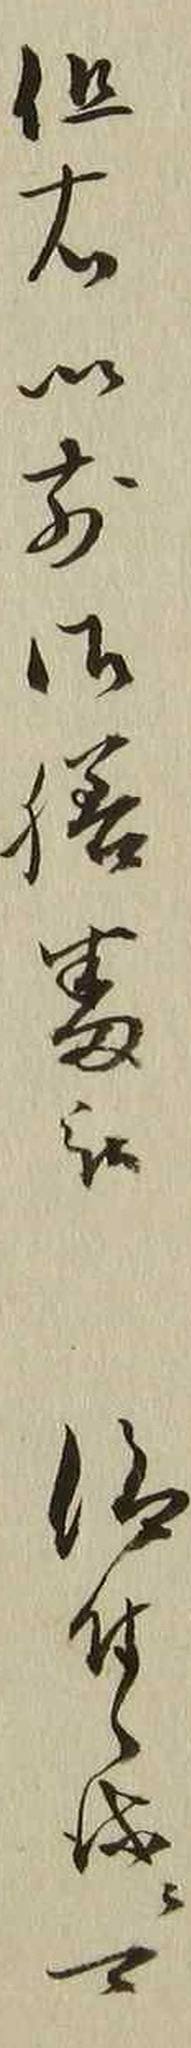但右以前御膳番被仰付候儀ニ可
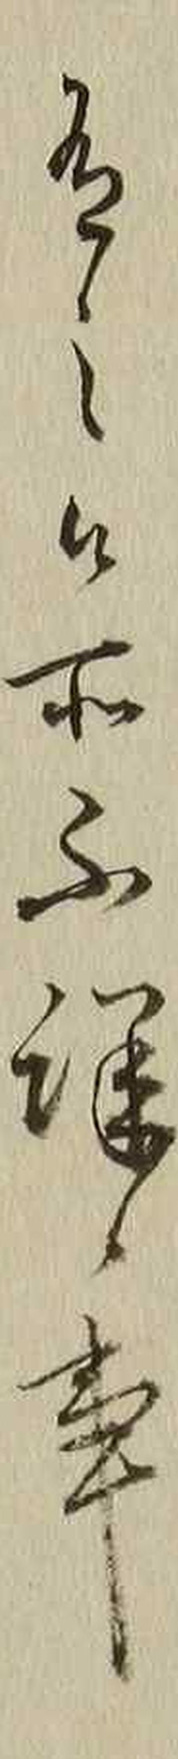有之候所不詳候事
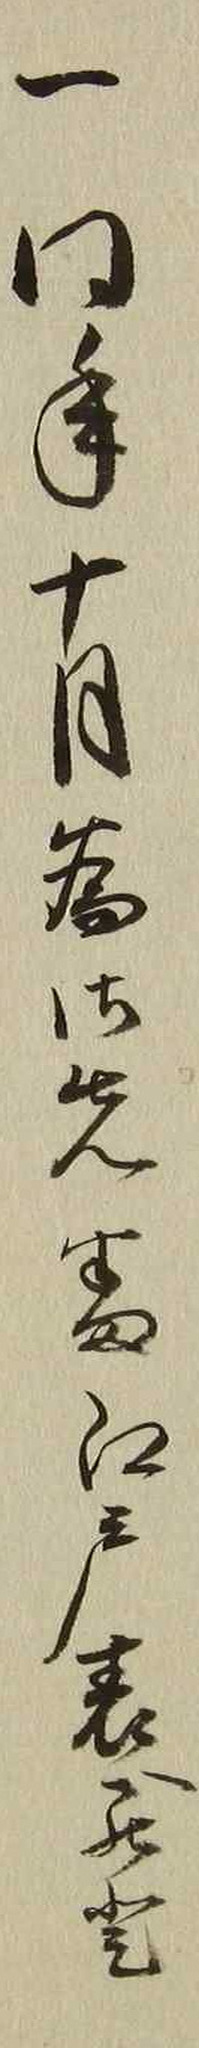一同年十月為御先番江戸表へ罷登
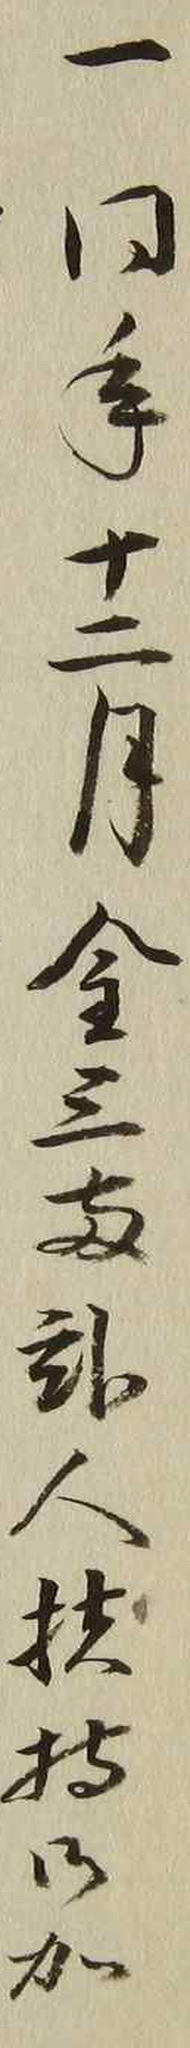一同年十二月金三両弐人扶持御加
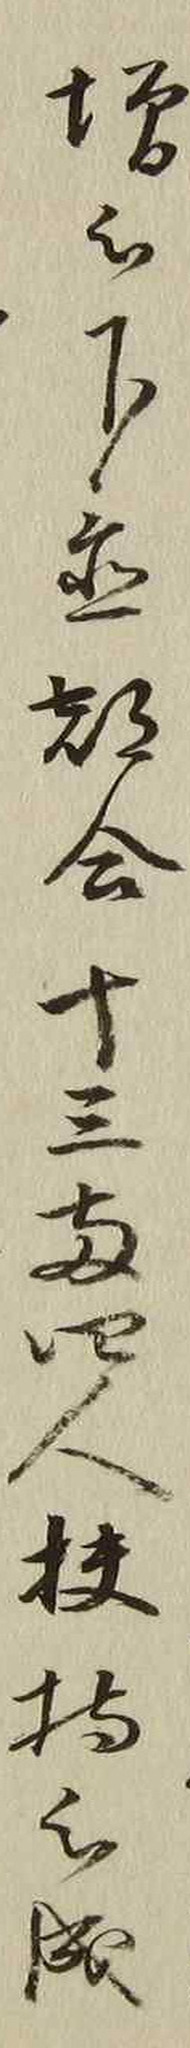増被下置都合十三両四人扶持被成
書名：諸士系譜　巻之69　を之部3
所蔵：会津若松市立会津図書館
